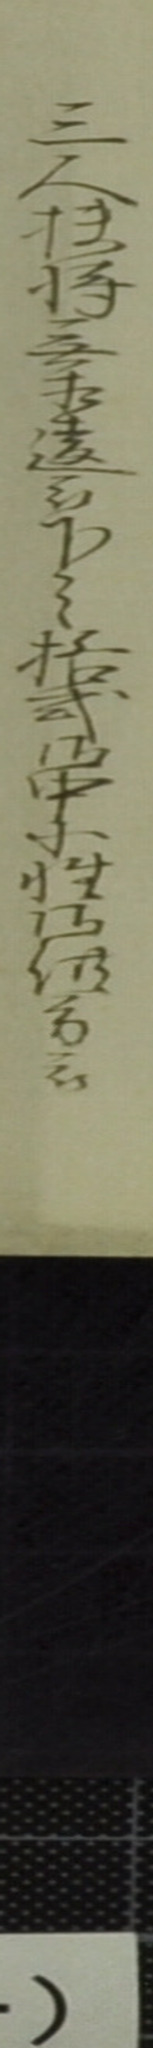三人扶持無相違被下之格式御中小性御供方被
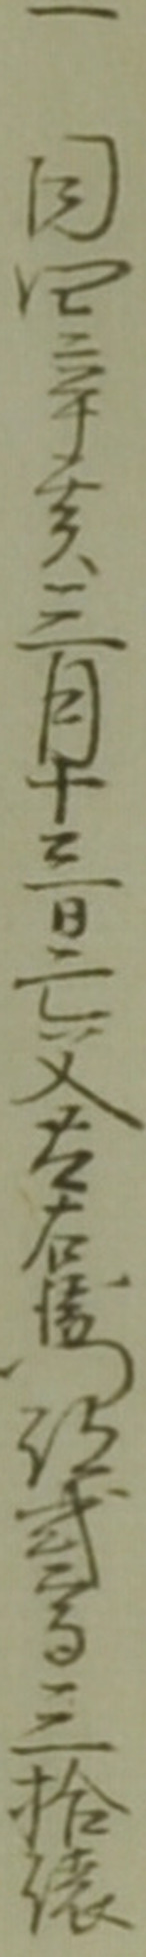一同四辛亥三月十三日亡父太右衛門跡式高三拾俵
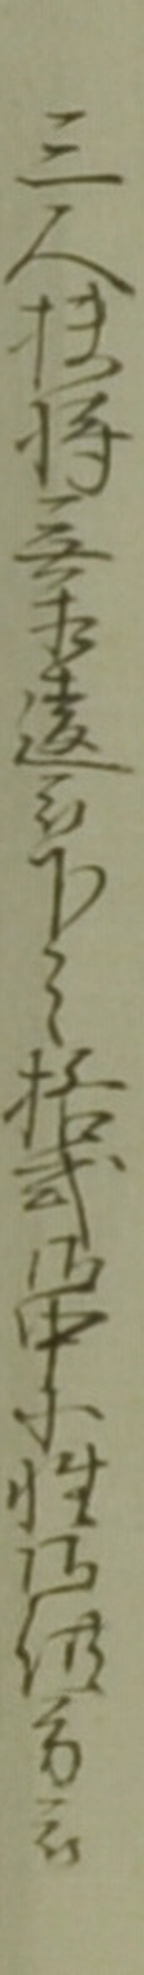三人扶持無相違被下之格式御中小性御供方被

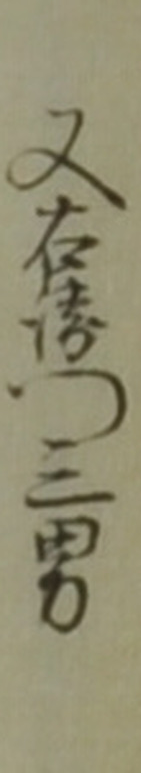又右衛門三男
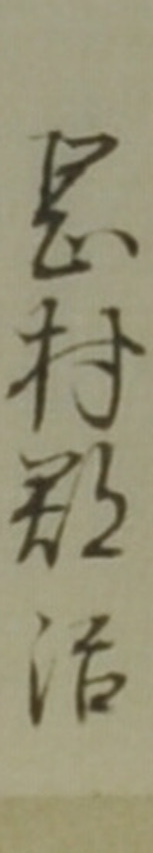岡村郡治
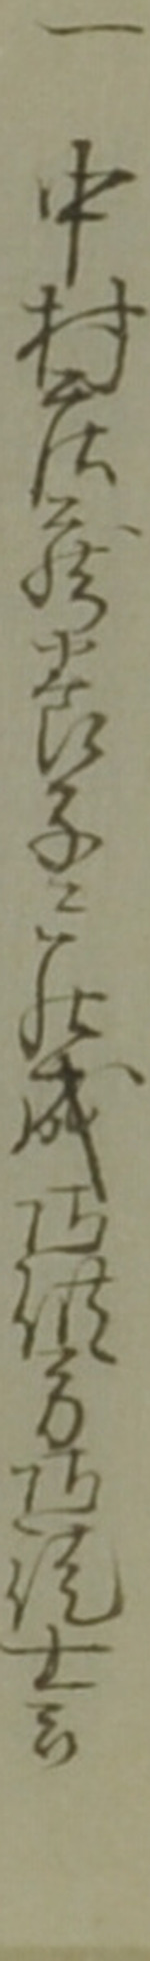一中村庄蔵養子ニ罷成御供方御徒士被
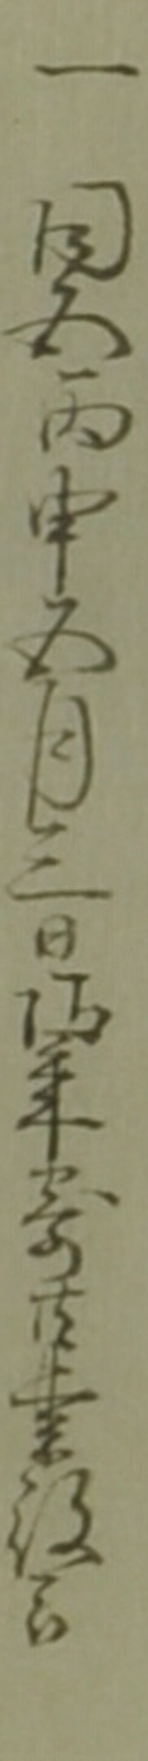一同五丙申五月三日御年寄共書役被
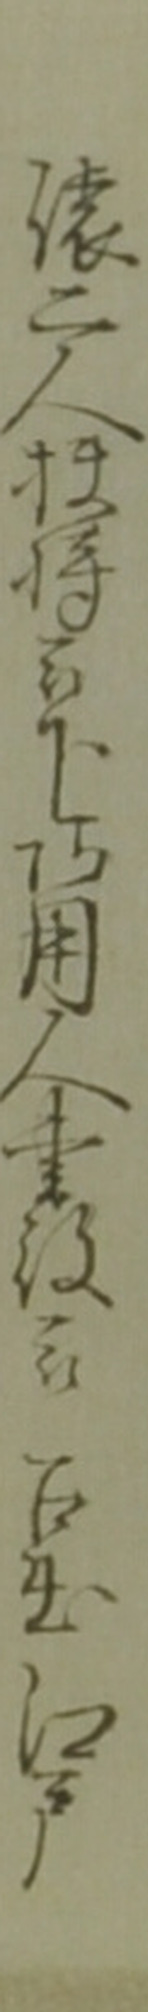俵二人扶持被下御用人書役被召出江戸
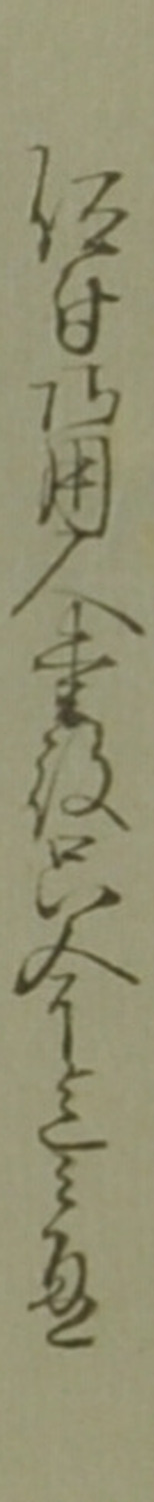仰付御用人書役只今迄之通
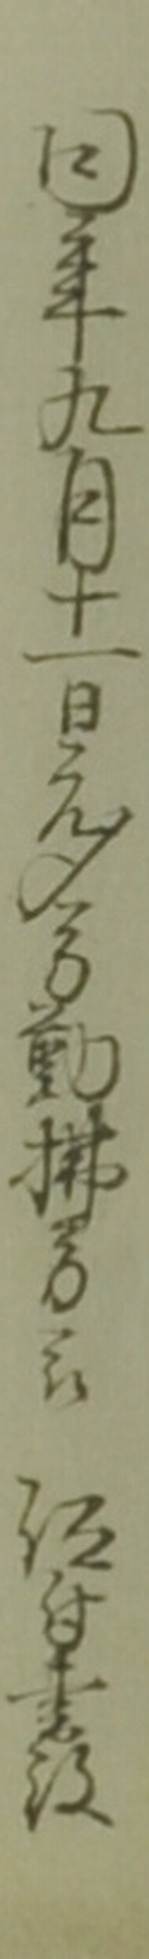一同年九月十一日元〆方勤払被仰付書役
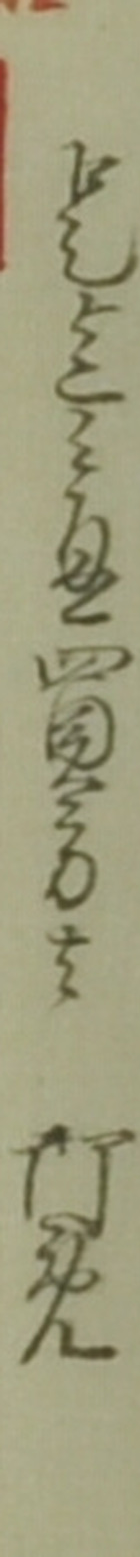是迄之通買方者御免

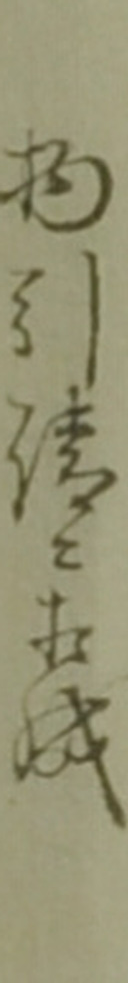物引請ニ相成
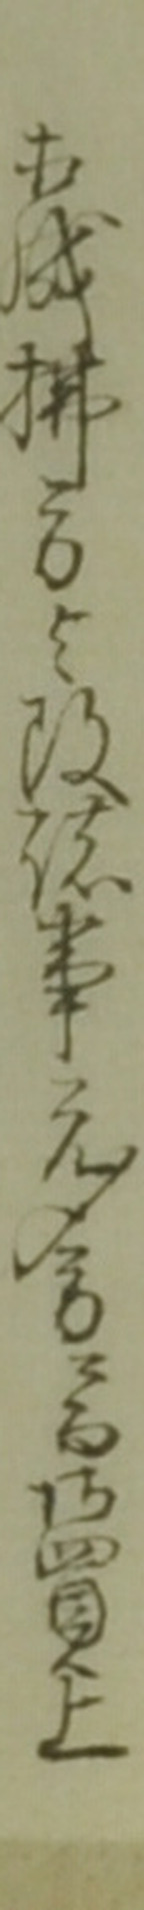相成払方与改諸事元〆方ニ而御買上
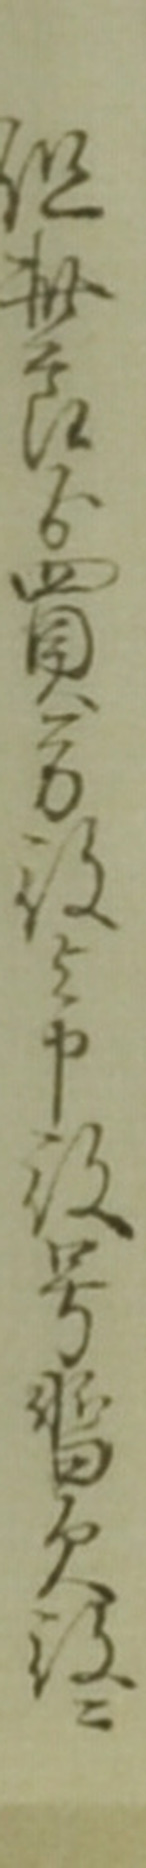但此節ゟ買方役与申役合暫欠役ニ
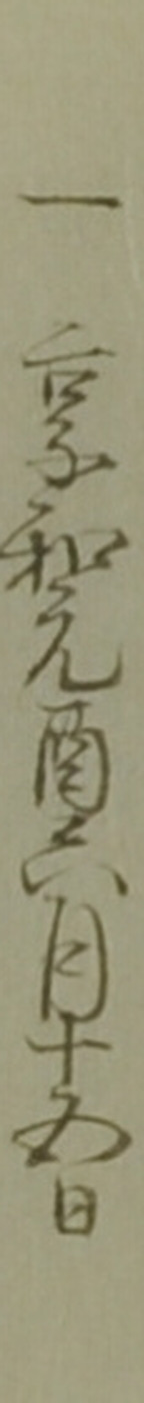一享和元酉六月十五日
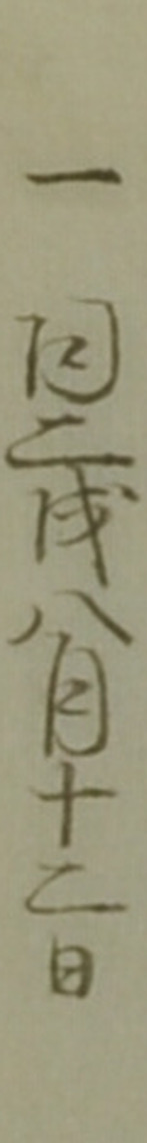一同二戌八月十二日
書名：無足諸士勤仕録（一）
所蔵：伊那市立高遠町図書館・合同会社AMANE
